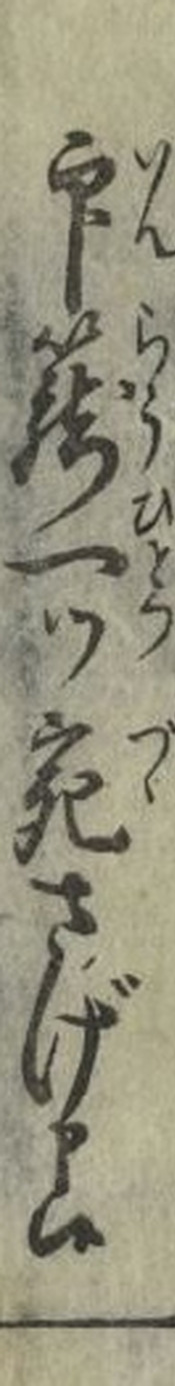印籠一つ宛さげ申候
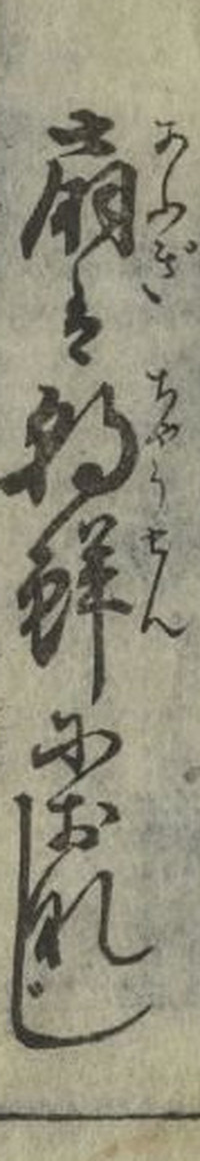扇は朝鮮におなじ
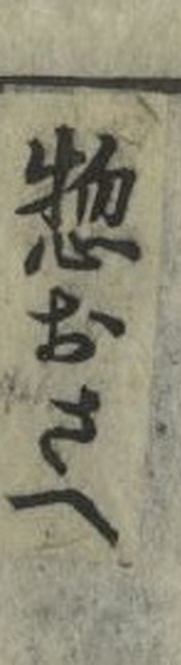惣おさへ
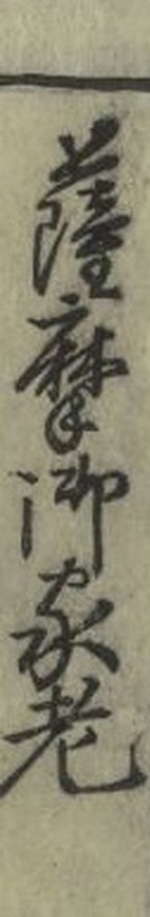薩摩御家老
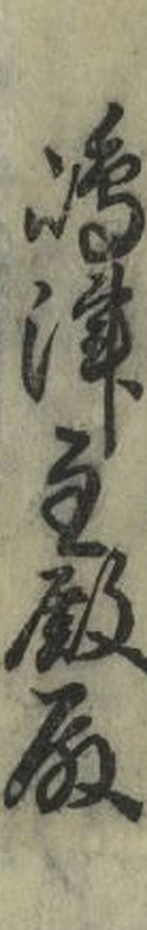嶋津主殿殿
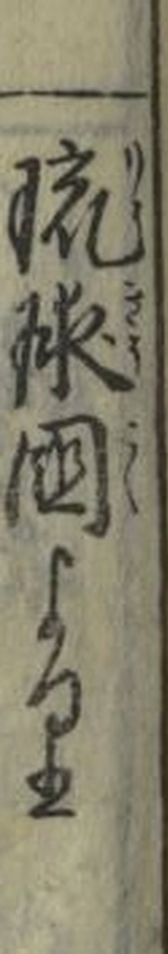琉球国より
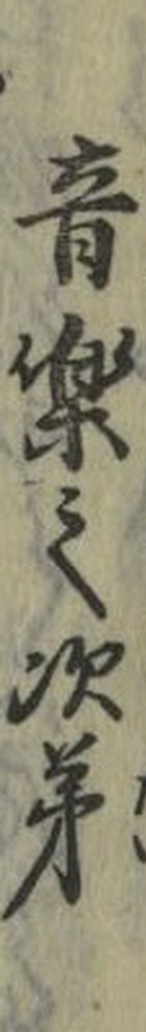音楽之次第
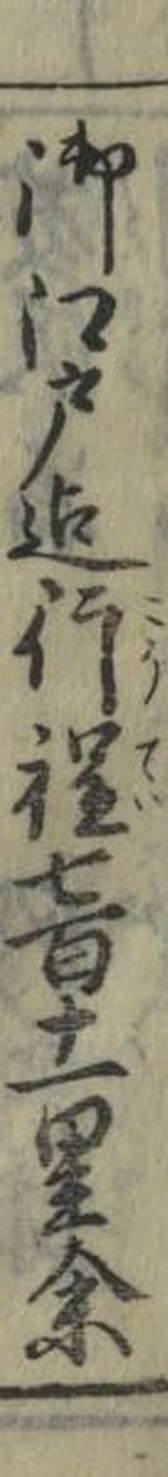御江戸迄行程七百十一里余
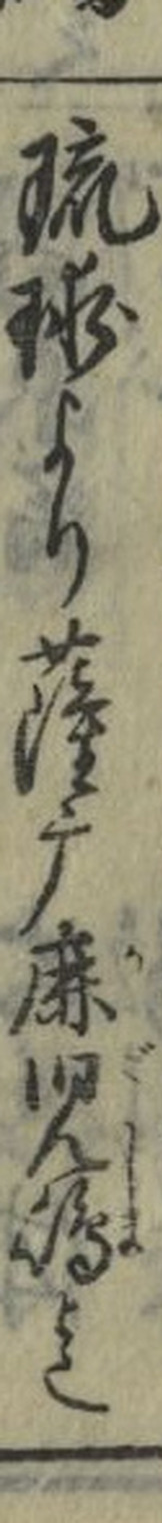琉球より薩摩鹿児嶋迄
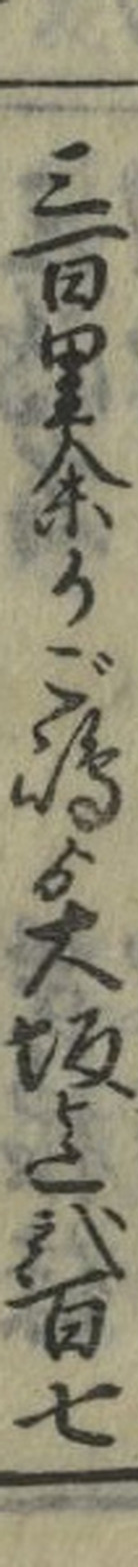三百里余かご嶋より大坂迄弐百七
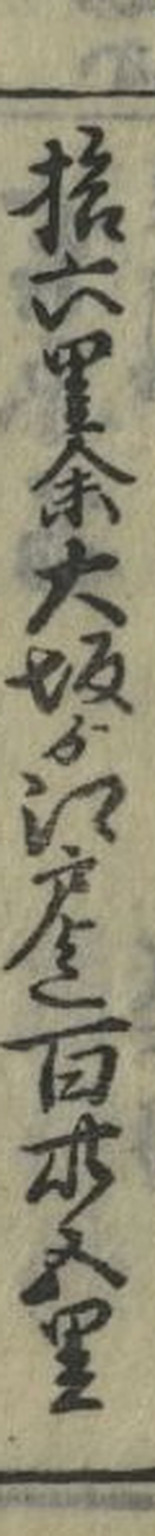拾六里余大坂より江戸迄百丗五里
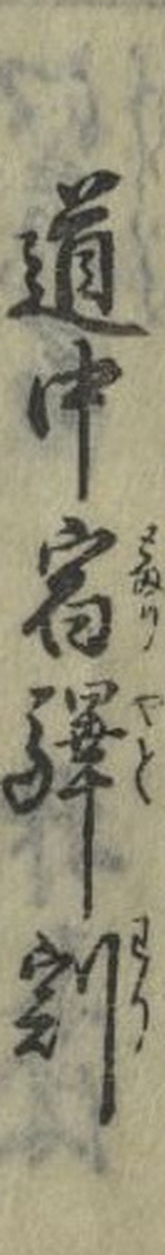道中宿驛割
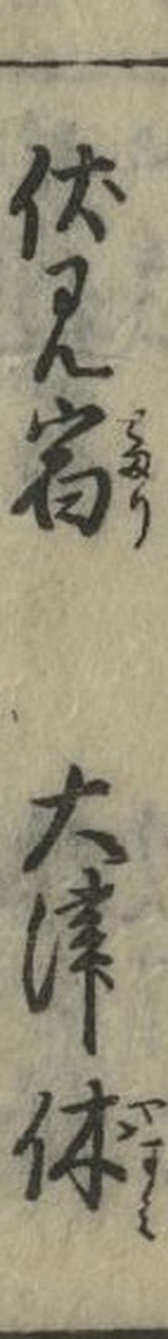伏見宿大津休
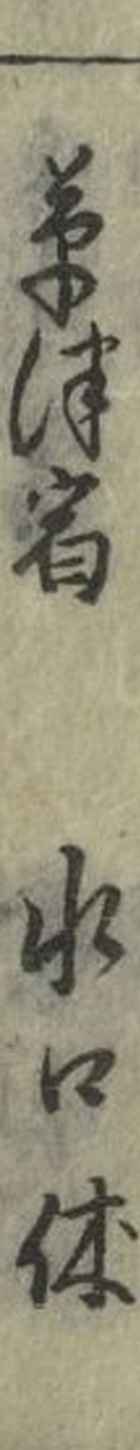草津宿水口休

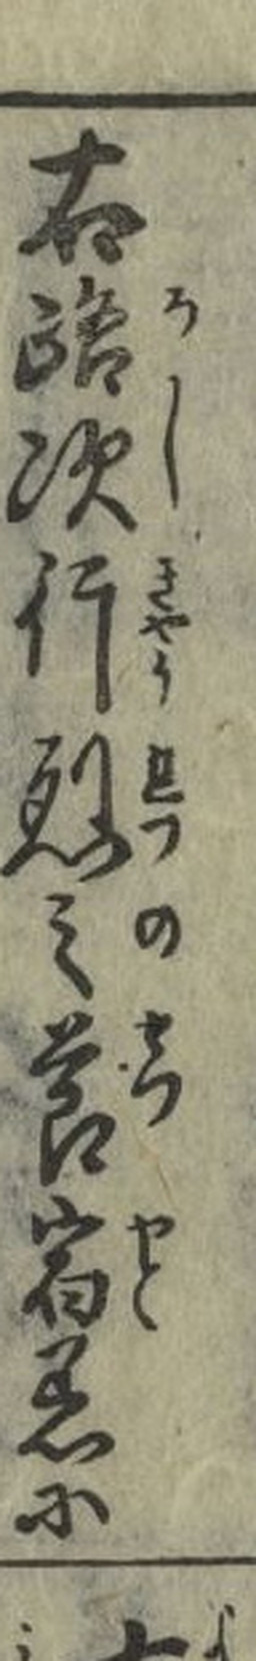右路次行烈の節宿着に
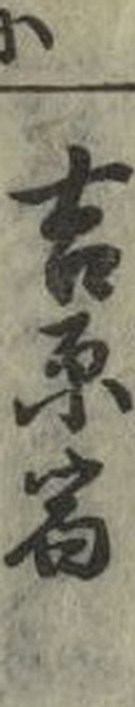吉原宿
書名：琉球人大行列記
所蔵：University of the Ryukyus Library
